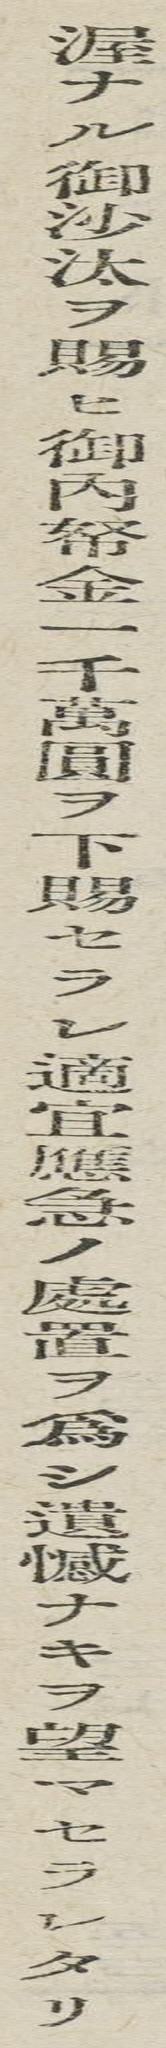渥ナル御沙汰ヲ賜ヒ御内帑金一千万円ヲ下賜セラレ適宜応急ノ処置ヲ為シ遺憾ナキヲ望マセラレタリ
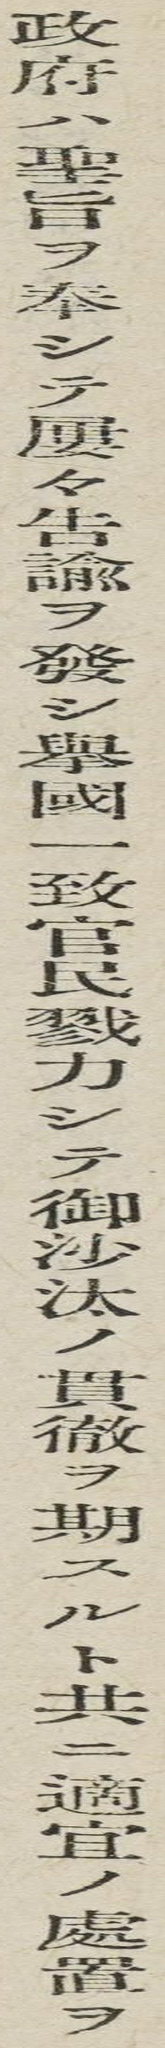政府ハ聖旨ヲ奉シテ屡々告諭ヲ発シ挙国一致官民戮力シテ御沙汰ノ貫徹ヲ期スルト共ニ適宜ノ処置ヲ
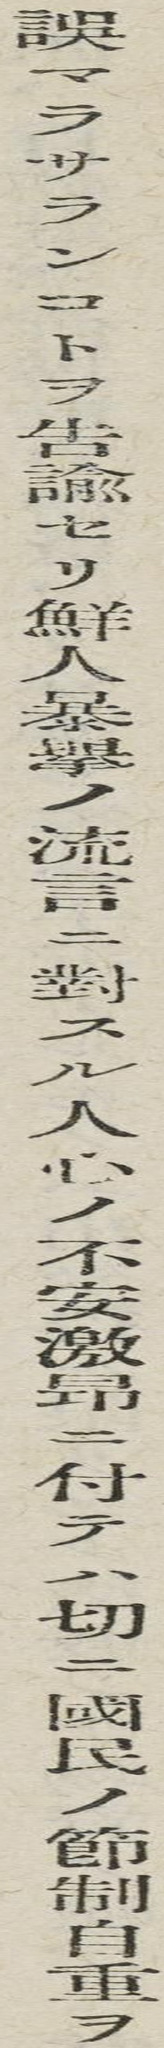誤マラサランコトヲ告諭セリ鮮人暴挙ノ流言ニ対スル人心ノ不安激昂ニ付テハ切ニ国民ノ節制自重ヲ
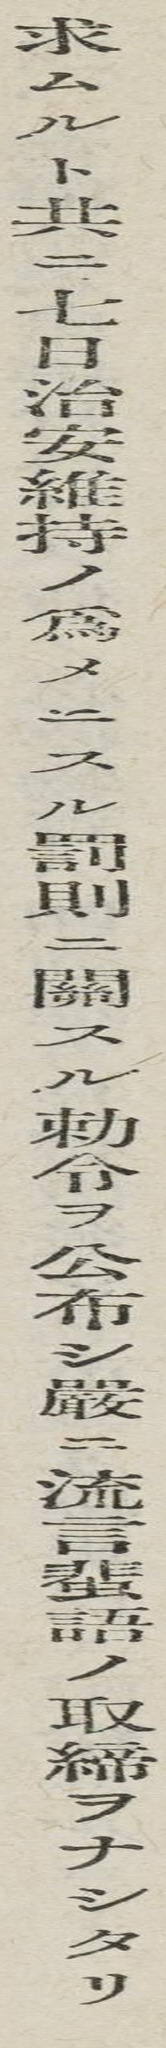求ムルト共ニ七日治安維持ノ為メニスル罰則ニ関スル勅令ヲ公布シ厳ニ流言蜚語ノ取締ヲナシタリ
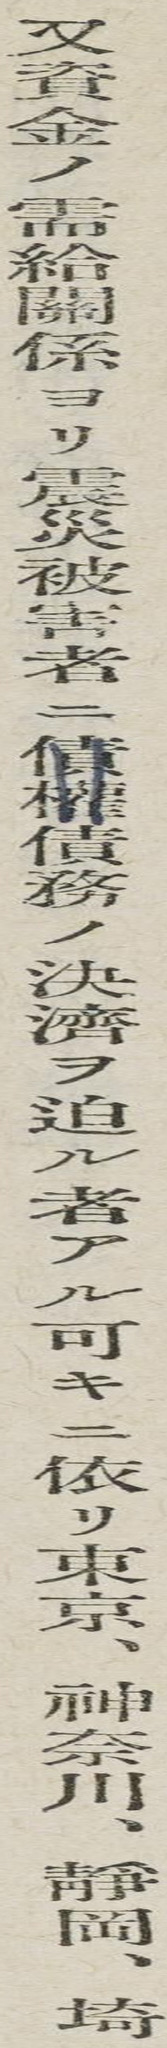又資金ノ需給関係ヨリ震災被害者ニ債務ノ決済ヲ迫ル者アル可キニ依リ東京、神奈川、静岡、埼
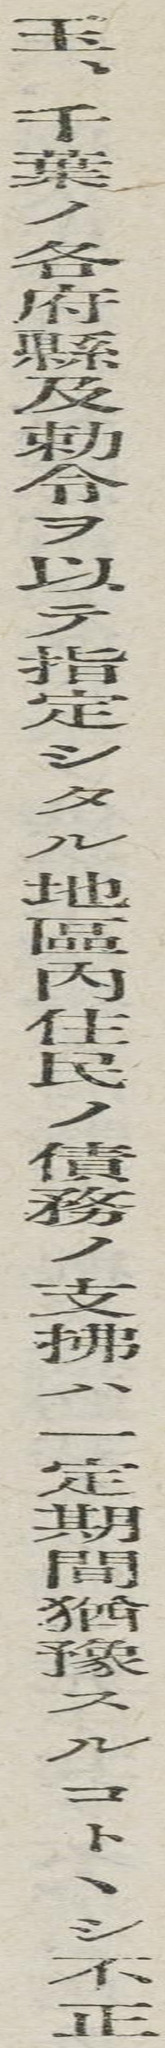玉、千葉ノ各府県及勅令ヲ以テ指定シタル地区内住民ノ債務ノ支払ハ一定期間猶予スルコトヽシ不正
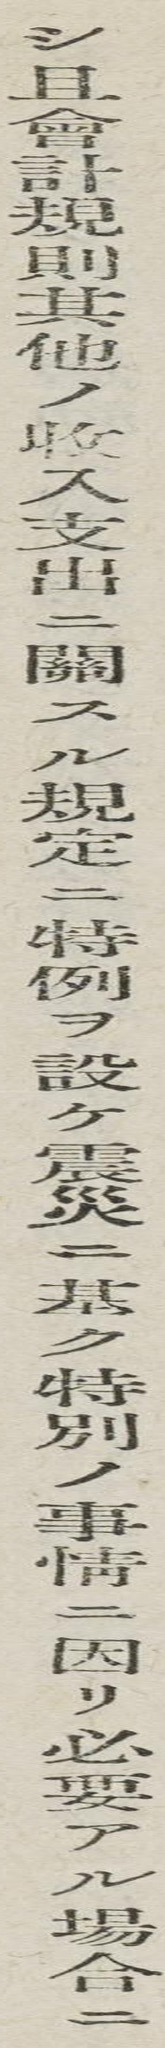シ且会計規則其他ノ収入支出ニ関スル規定ニ特例ヲ設ケ震災ニ基ク特別ノ事情ニ因リ必要アル場合ニ
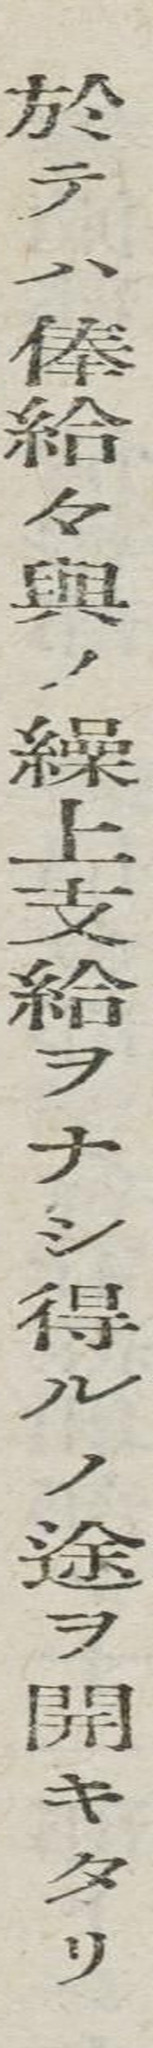於テハ俸給々与ノ繰上支給ヲナシ得ルノ途ヲ開キタリ
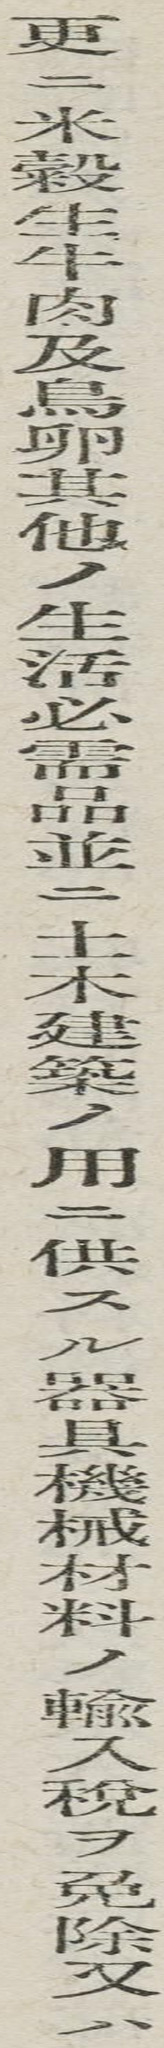更ニ米穀生牛肉及鳥卵其他ノ生活必需品並ニ土木建築ノ用ニ供スル器具機械材料ノ輸入税ヲ免除又ハ
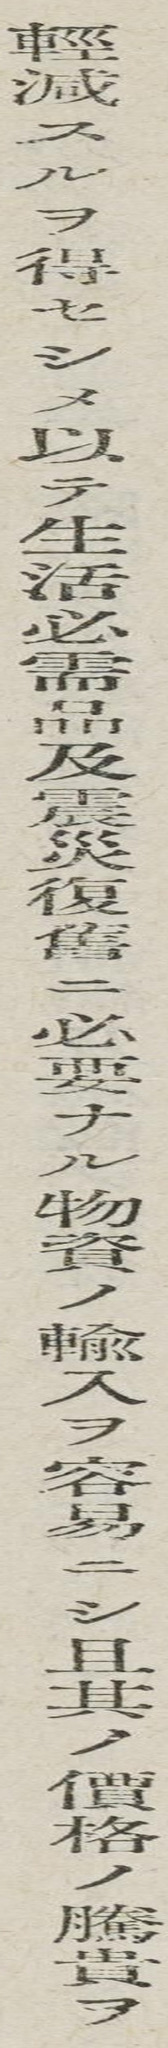軽減スルヲ得セシメ以テ生活必需品及震災復旧ニ必要ナル物資ノ輸入ヲ容易ニシ且其ノ価格ノ騰貴ヲ
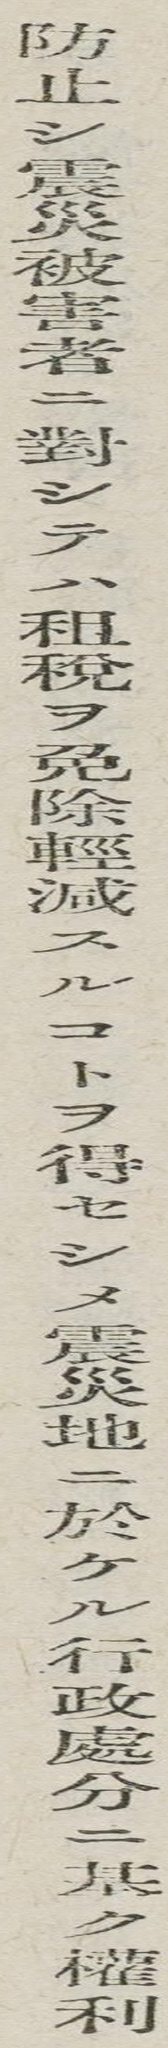防止シ震災被害者ニ対シテハ租税ヲ免除軽減スルコトヲ得セシメ震災地ニ於ケル行政処分ニ基ク権利
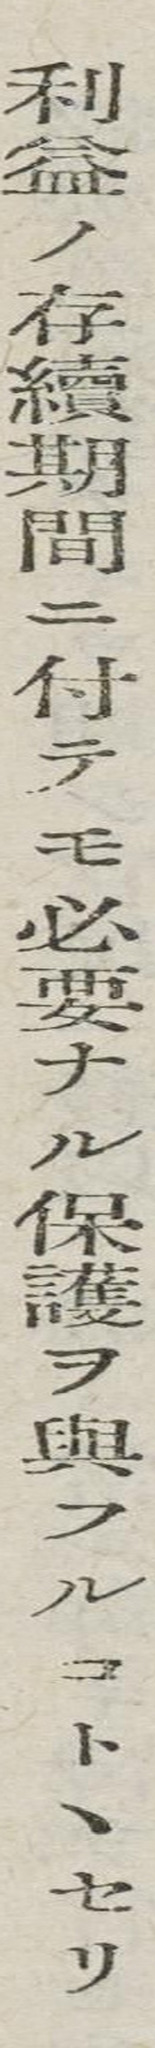利益ノ存続期間ニ付テモ必要ナル保護ヲ与フルコトヽセリ
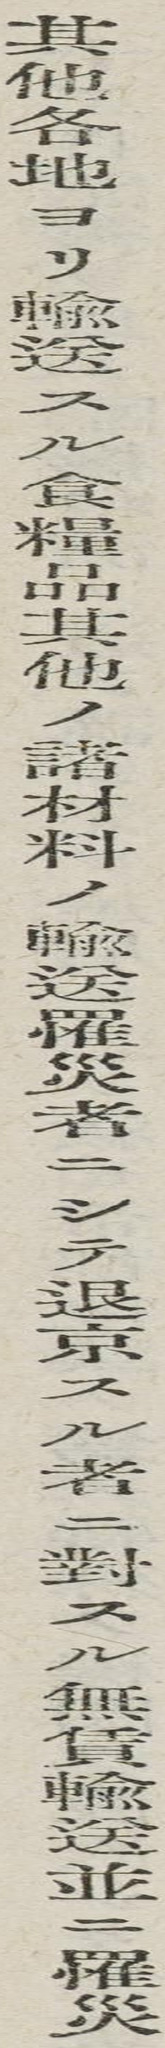其他各地ヨリ輸送スル食糧品其他ノ諸材料ノ輸送罹災者ニシテ退京スル者ニ対スル無賃輸送並ニ罹災
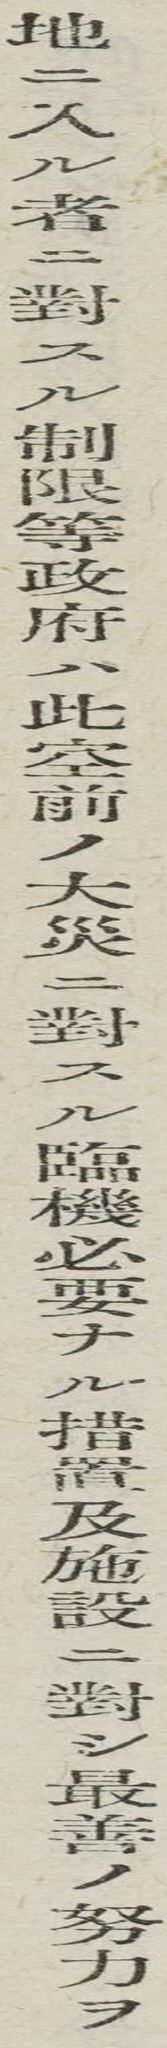地ニ入ル者ニ対スル制限等政府ハ此空前ノ大災ニ対スル臨機必要ナル措置及施設ニ対シ最善ノ努力ヲ

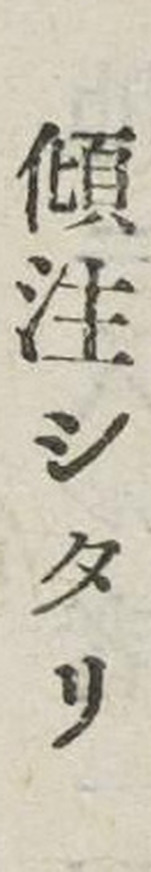傾注シタリ
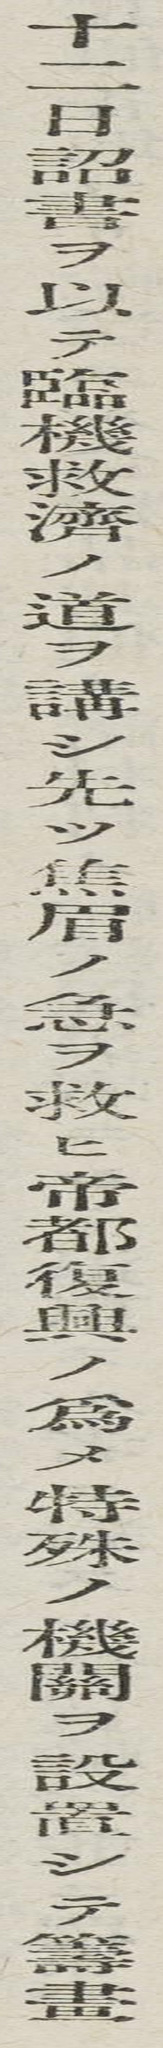十二日詔書ヲ以テ臨機救済ノ道ヲ講シ先ツ焦眉ノ急ヲ救ヒ帝都復興ノ為メ特殊ノ機関ヲ設置シテ籌畫
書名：震災被害状況並救護施設概要
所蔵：東京大学地震研究所図書室 Earthquake Research Institute Library, The University of Tokyo, JAPAN
